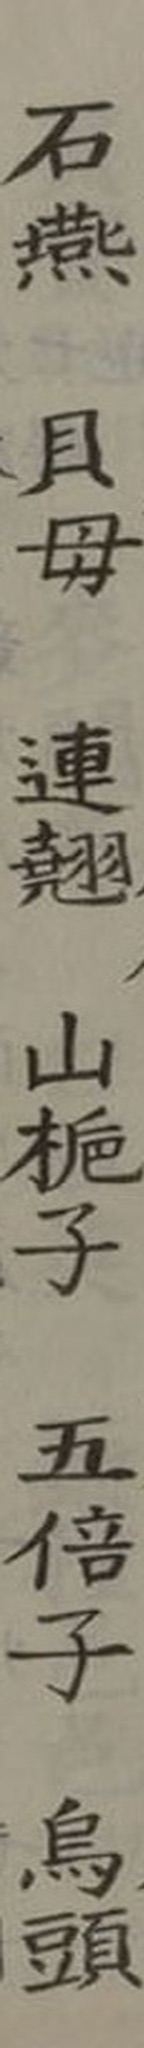石燕貝母連翹山梔子五倍子烏頭
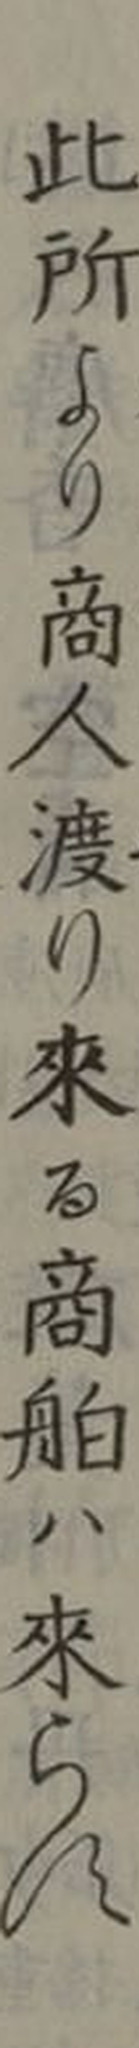此所より商人渡り來る商舶は來らす
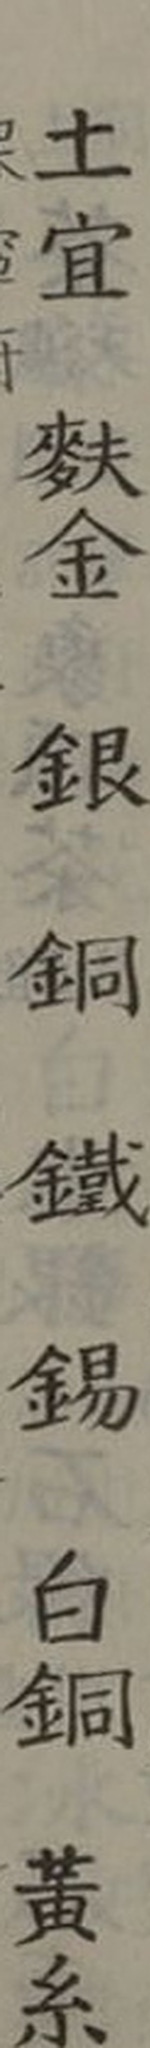土宜麩金銀銅鐵錫白銅黄糸

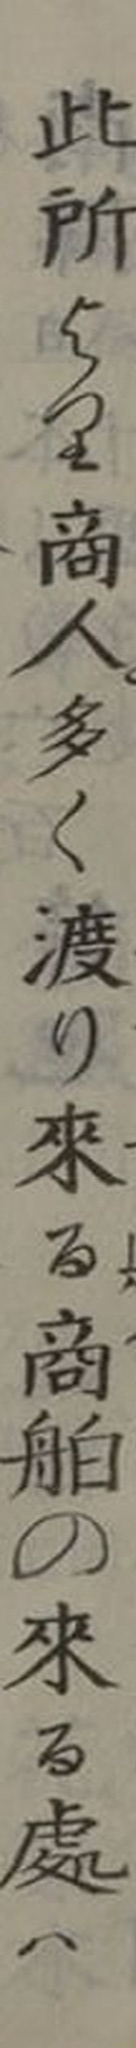此所より商人多く渡り來る商舶の來る處は

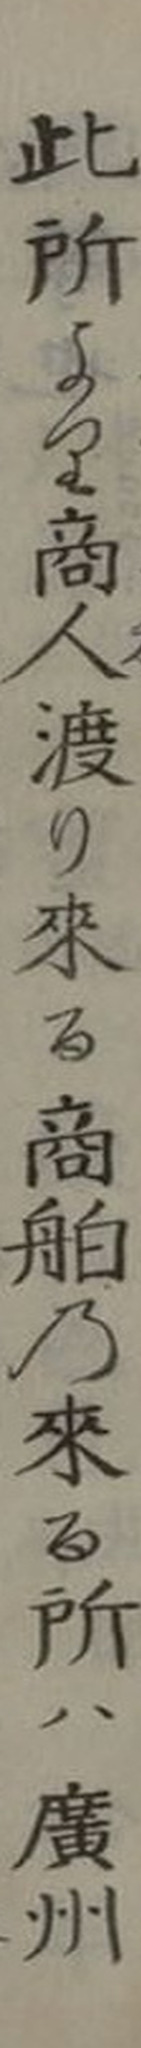此所より商人渡り來る商舶の來る所は廣州

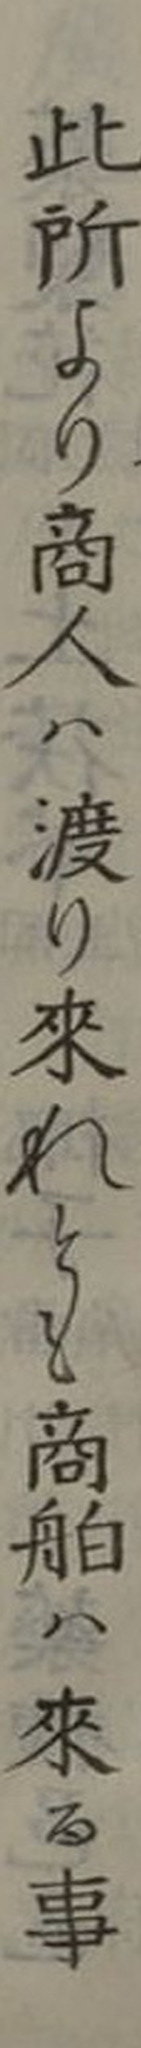此所より商人は渡り來れとも商舶は來る事
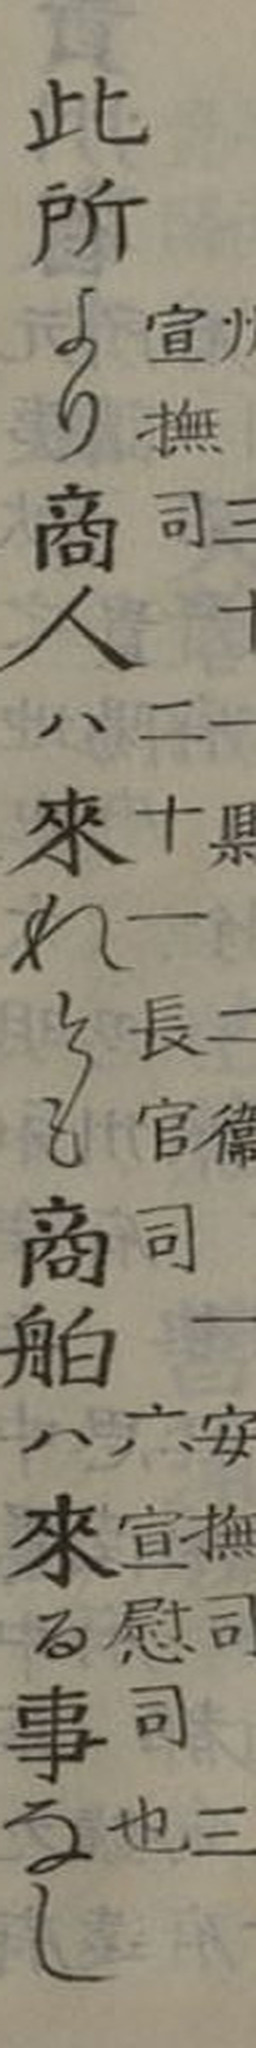此所より商人は來れとも商舶は來る事なし

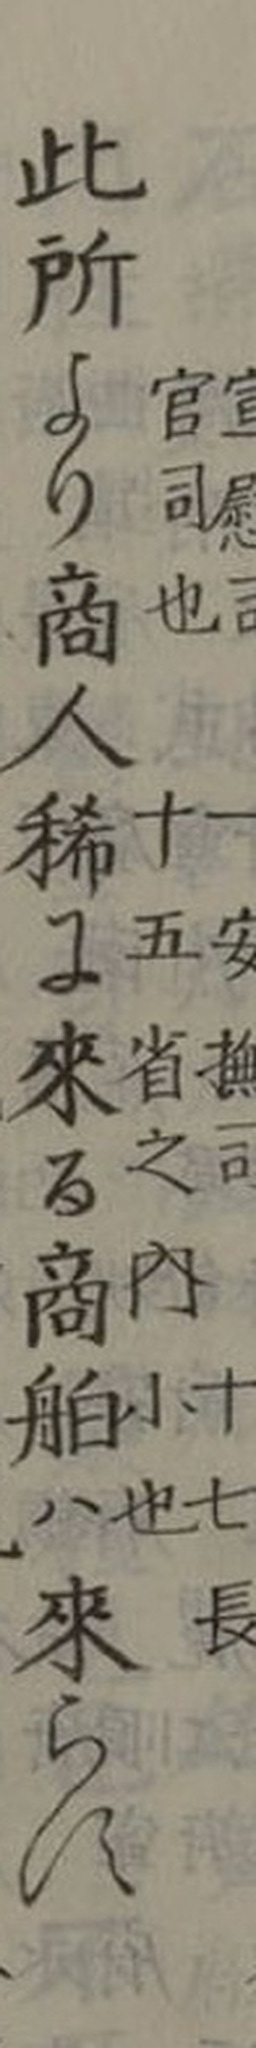此所より商人稀に來る商舶は來らす
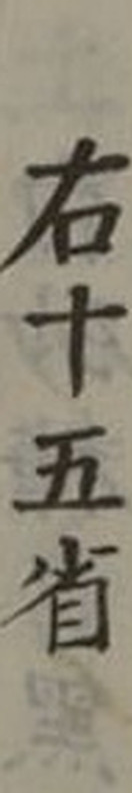右十五省
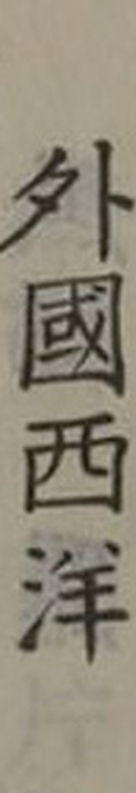外國西洋
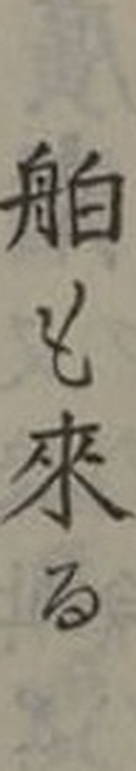舶も來る
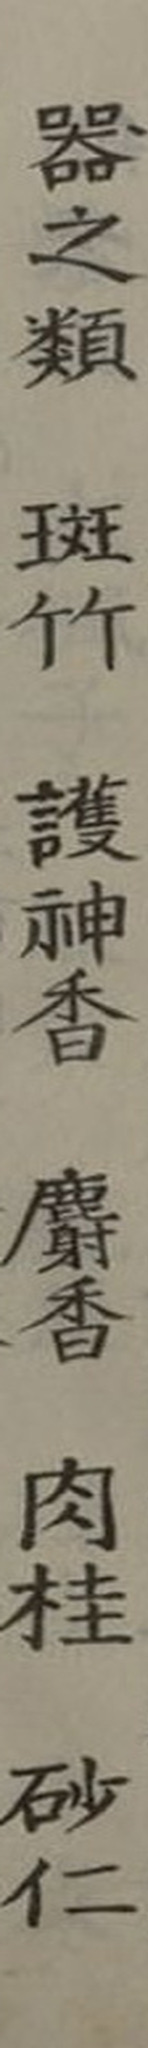器之類斑竹護神香麝香肉桂砂仁

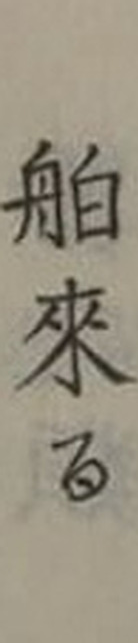舶來る
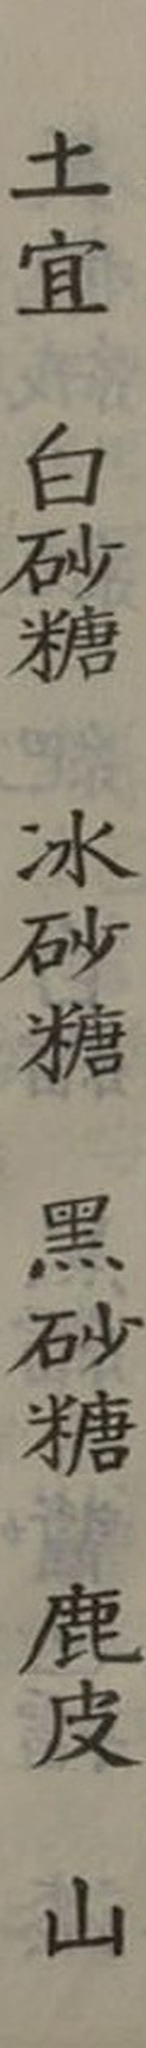土宜白砂糖冰砂糖黑砂糖鹿皮山
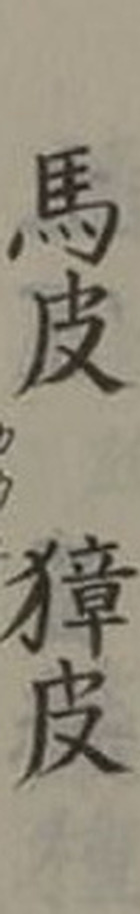馬皮獐皮
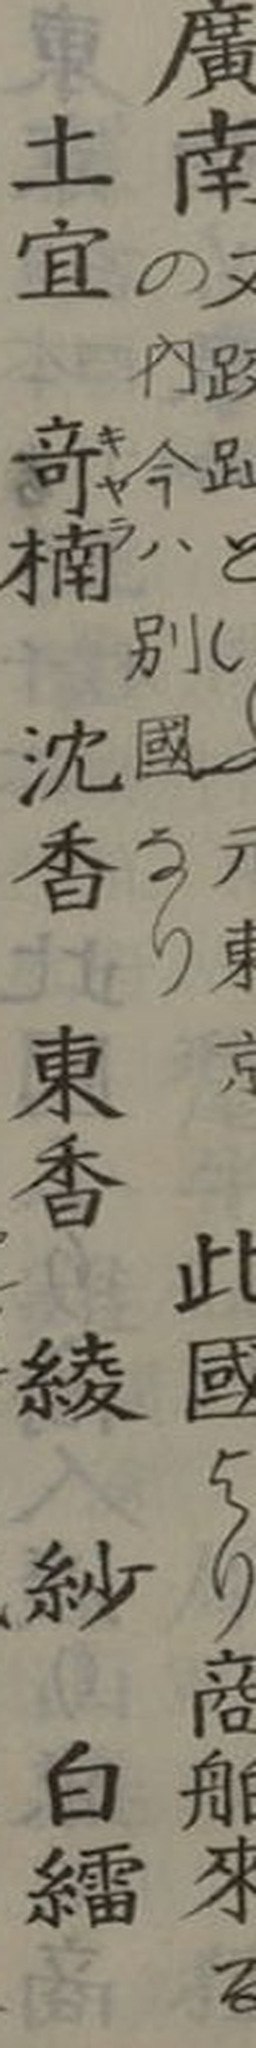土宜竒楠沈香東香綾紗白𦆙
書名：骨董録
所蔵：University of the Ryukyus Library
